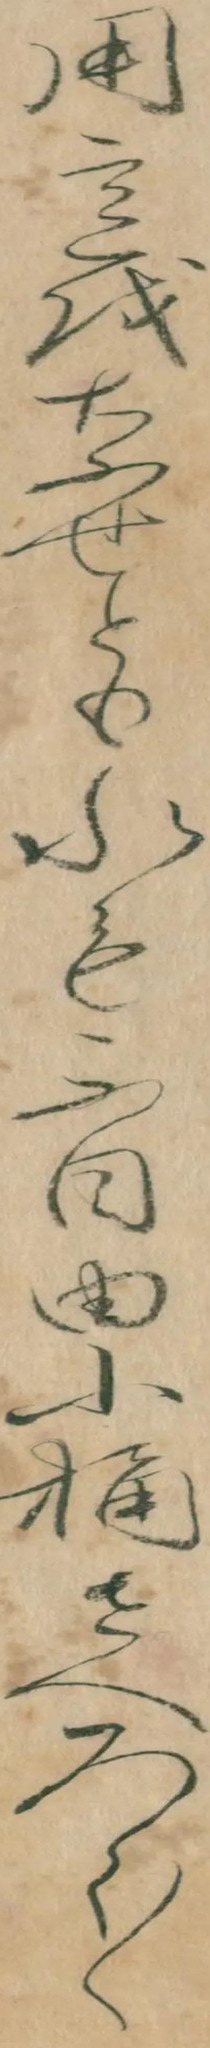用意をなせとも水も不自由に桶さへろく〳〵
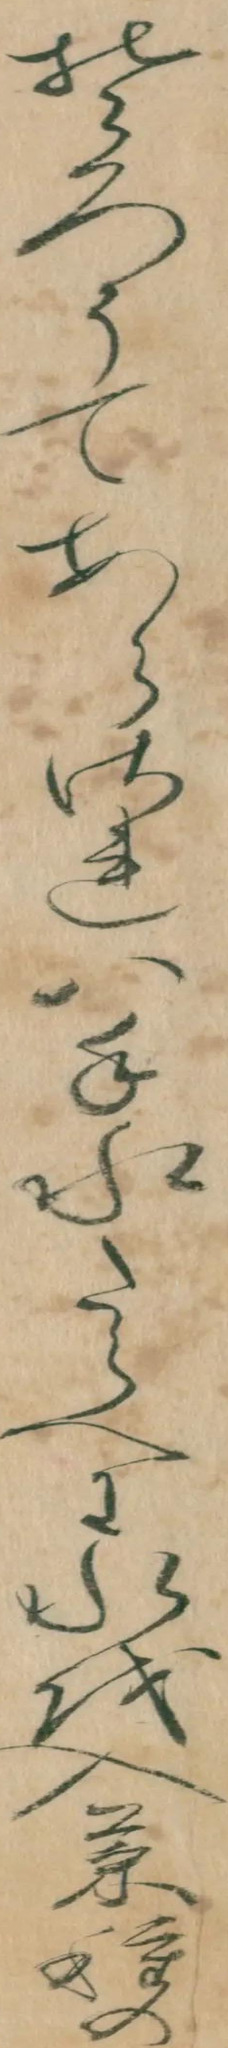そろうてあらされは手水たらへに水を入薬程の
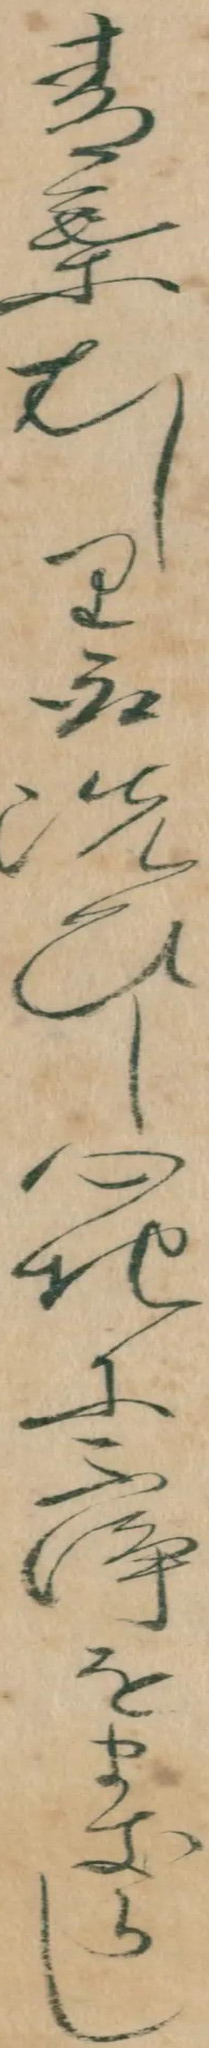青菜むしり取洗ひし心地に不浄をまきらし
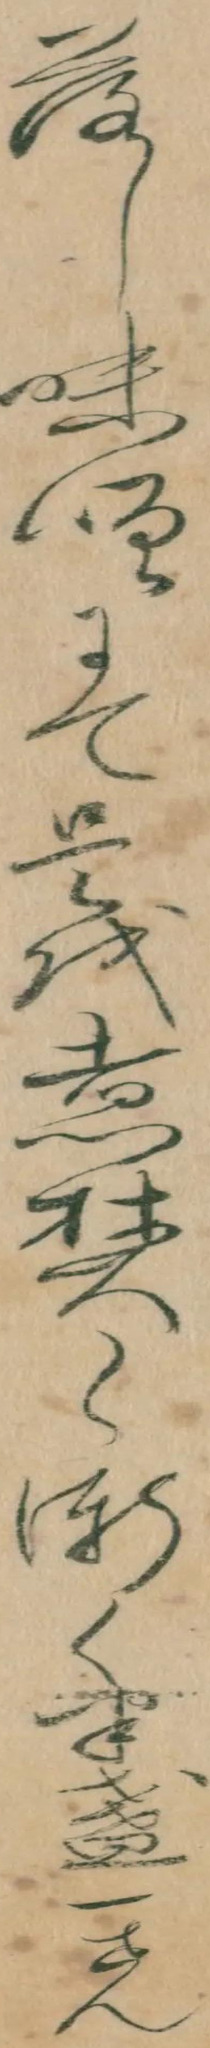落し味噌にて是を煮焚し漸く半盞一さん
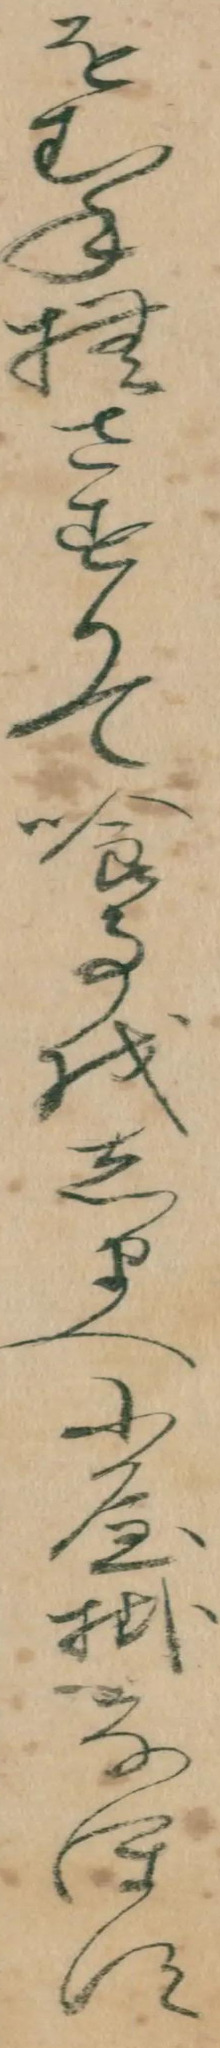をむね撫さすりて喰事をしまへ小屋掛なほす
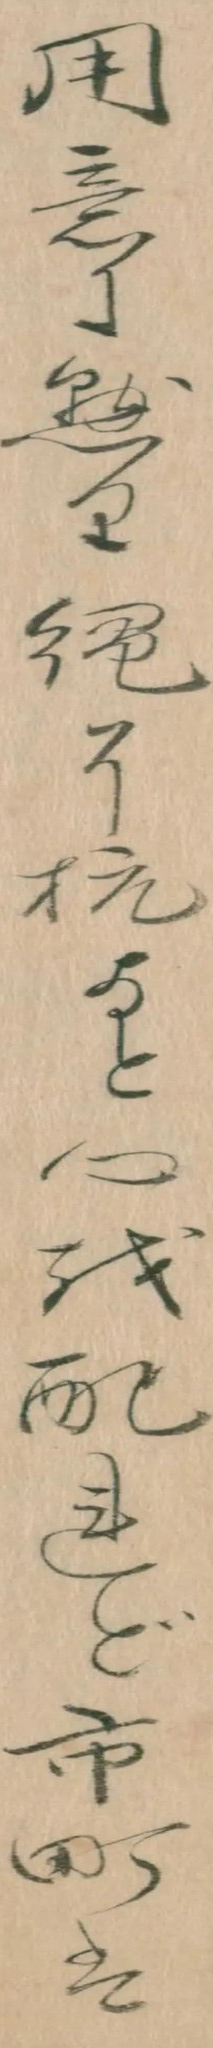用意に懸り縄に杭よと心を配れど市町は
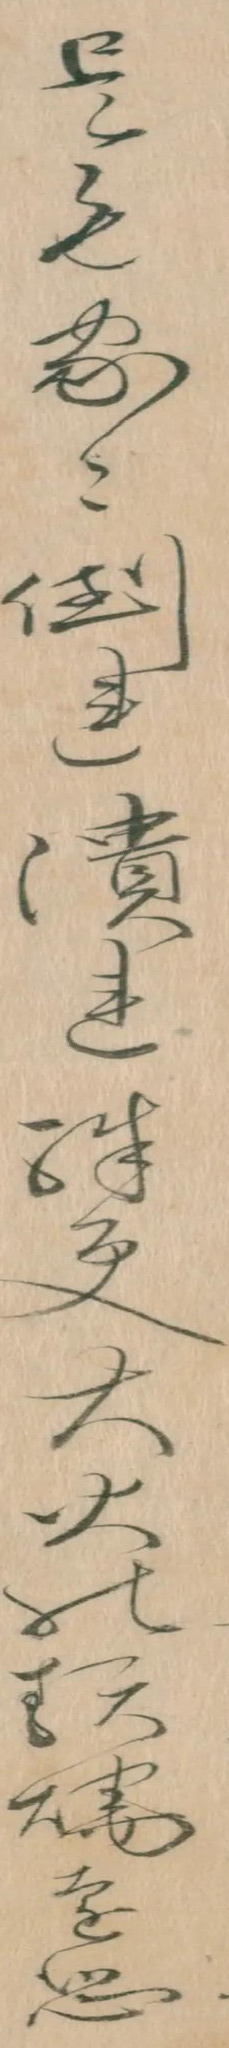是も家々倒れ潰れ殊更大火の類焼を恐
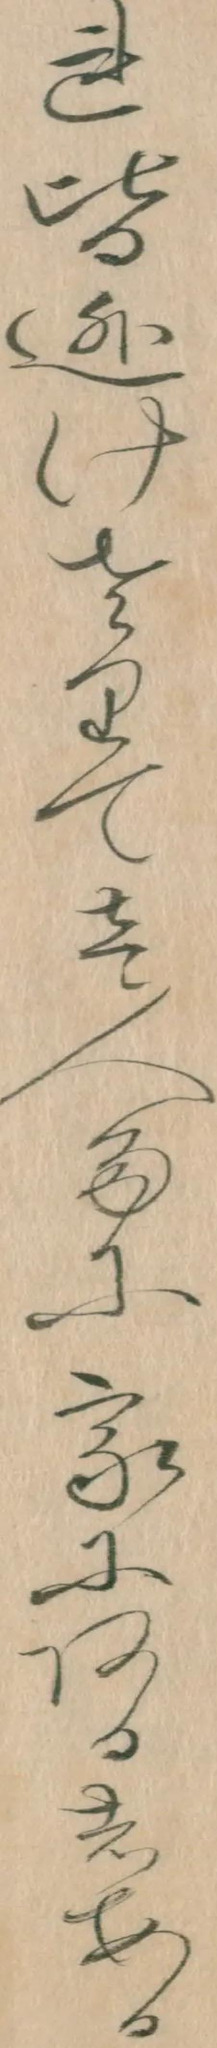れ皆逃けさりて壱人たに家にある者ある
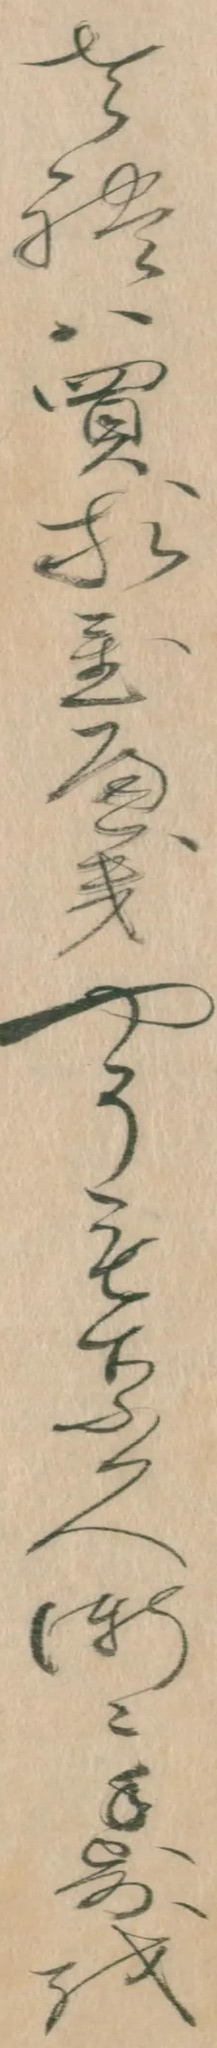されは買求置へきやうもなく漸々手寄を
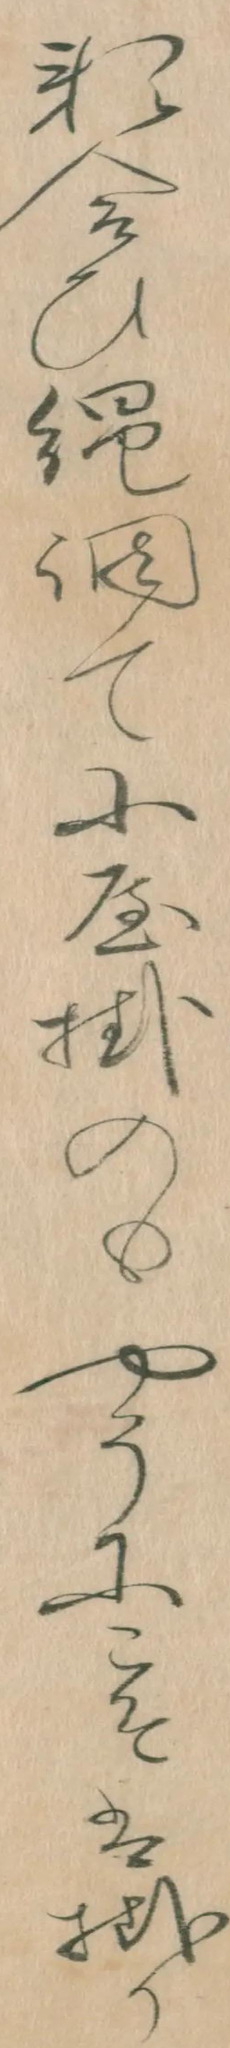頼合ひ縄網て小屋掛のもやうにこそは掛り
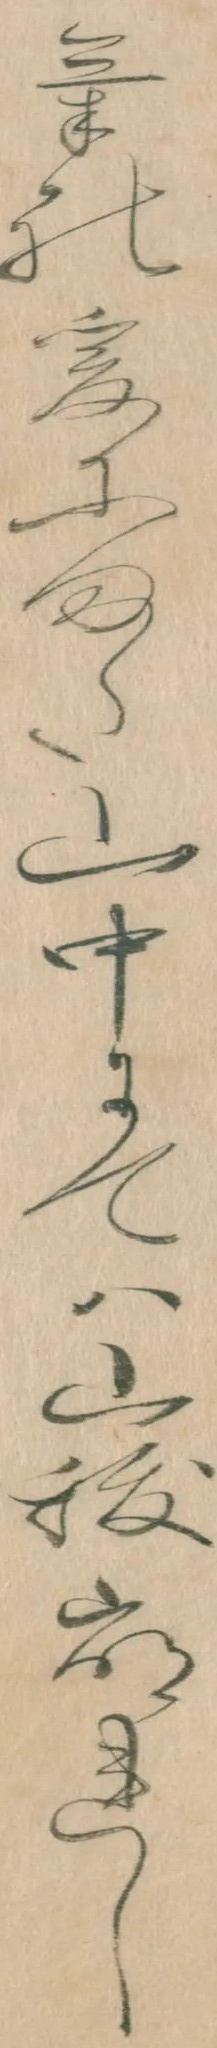けれ爰にまた山中にては山抜崩れし
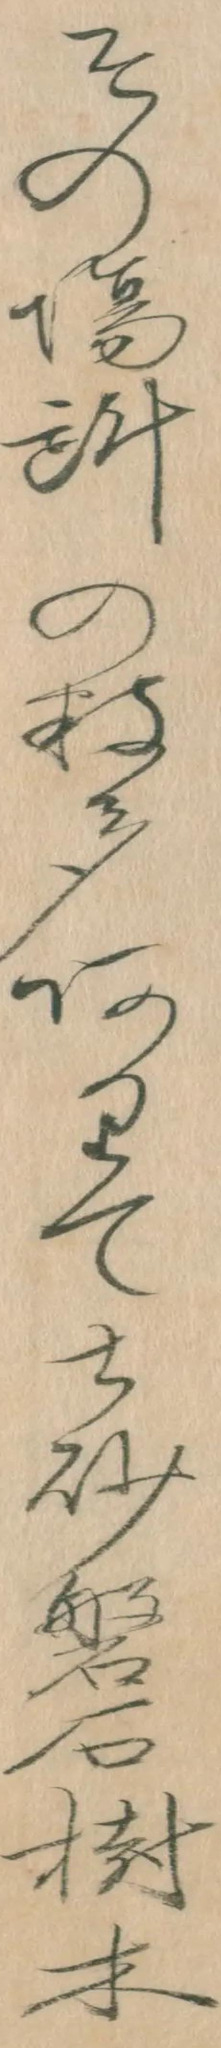その場所の数多ありて土砂磐石樹木
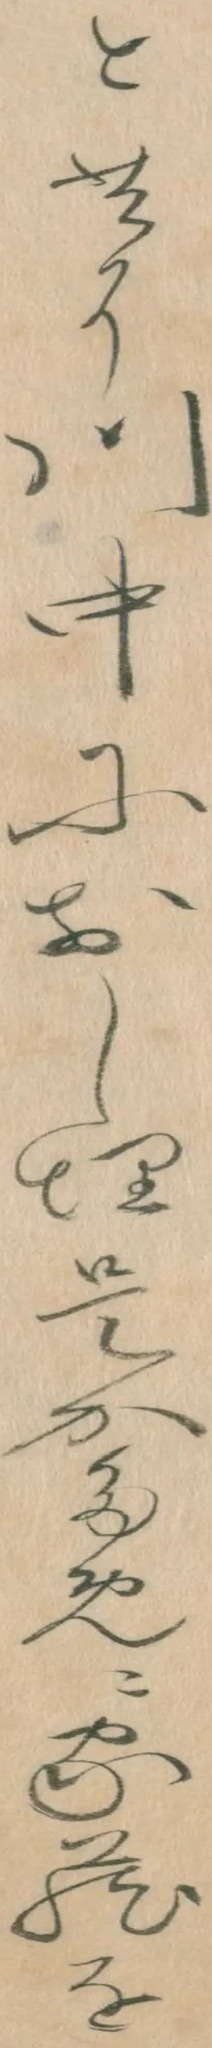と共に川中におし埋是かために家藏を
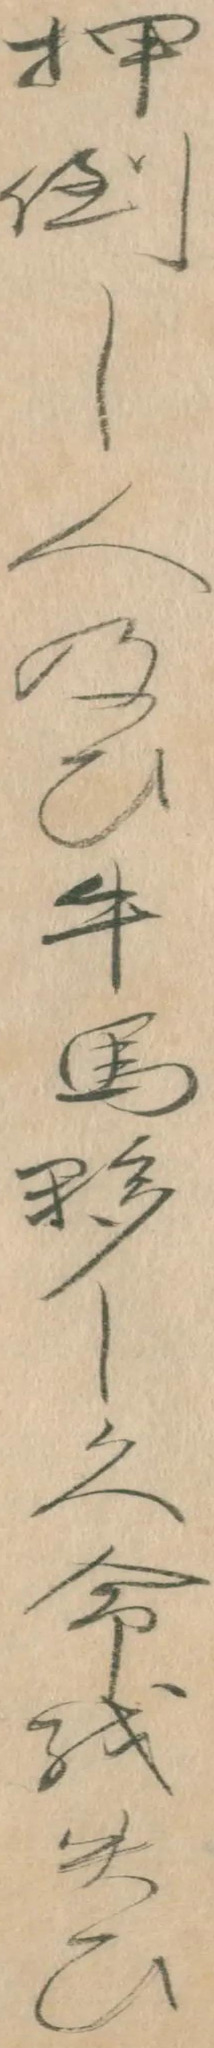押倒し人及ひ牛馬夥しく命を失ひ

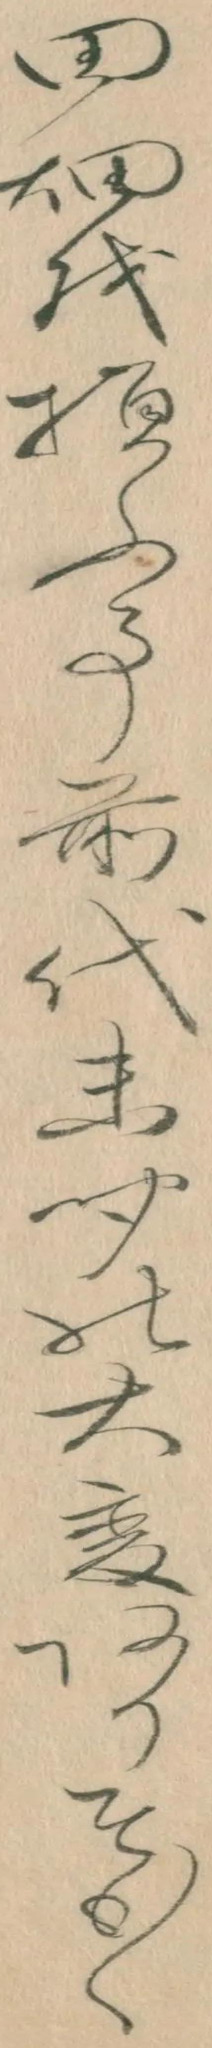田畑を損ふ事前代未聞の大変ありそも〳〵
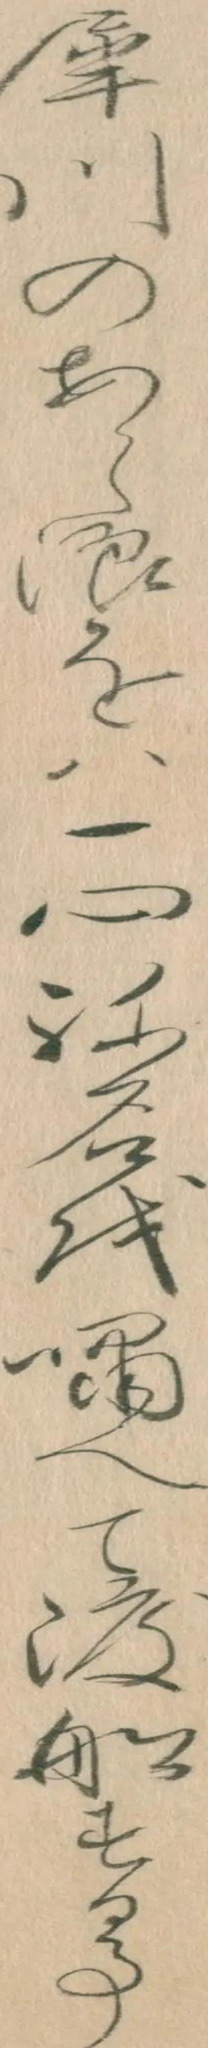犀川のあら浪をは一心称名を嘯へて渡船する事
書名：俗語之種. [5]
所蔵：国立国会図書館 National Diet Library, JAPAN
